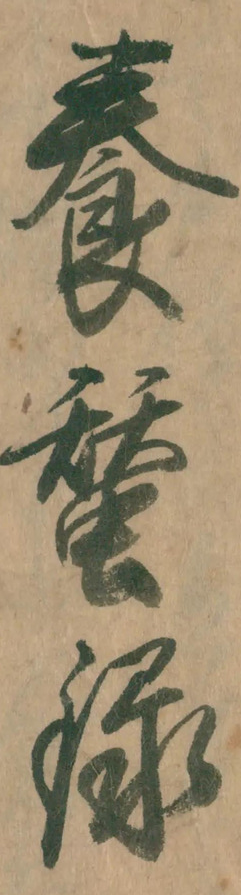養蚕録
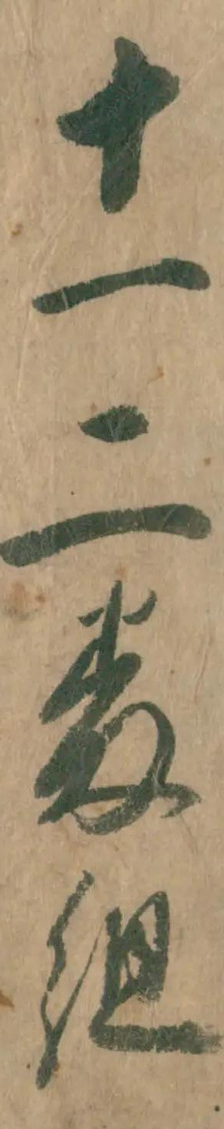十一二番組

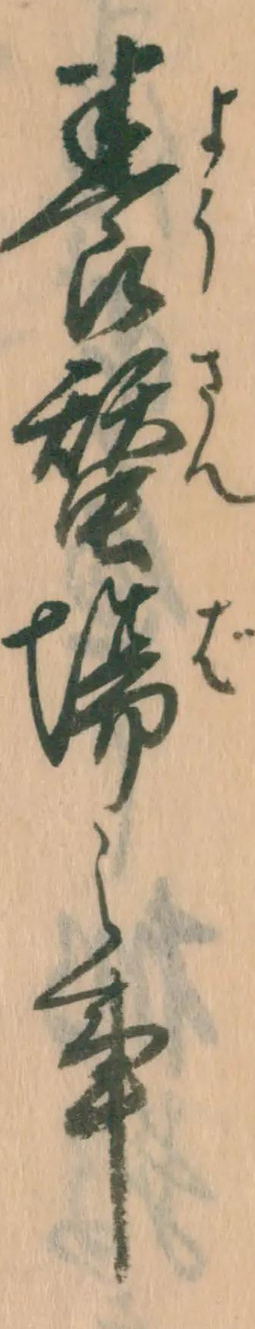養蚕場の事
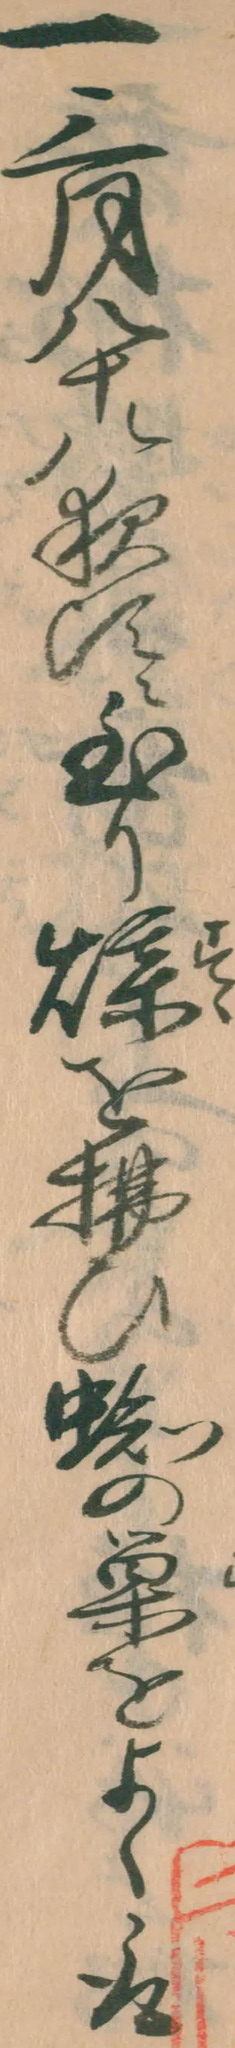一三月八十八夜頃に至り煤を払ひ蜘の巣をよく取
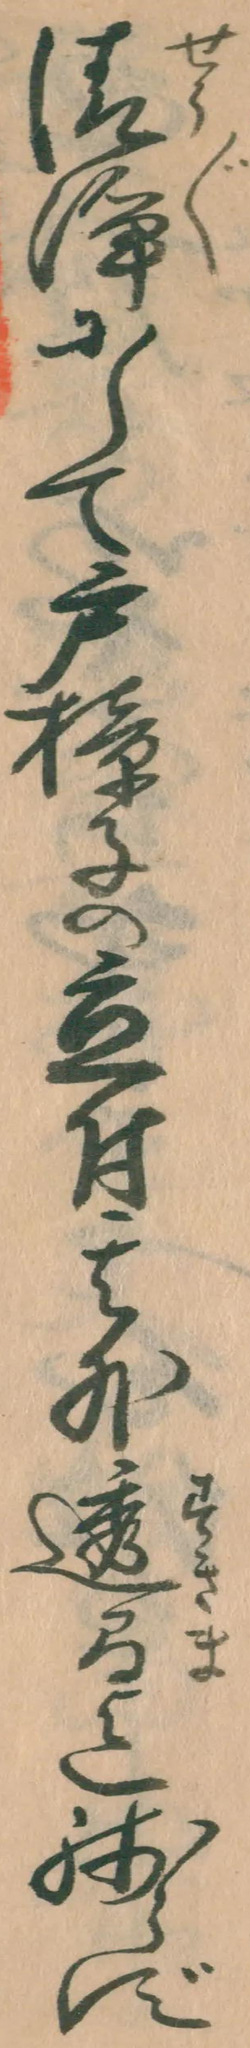清浄にして戸障子の立付其外透間迄残らず
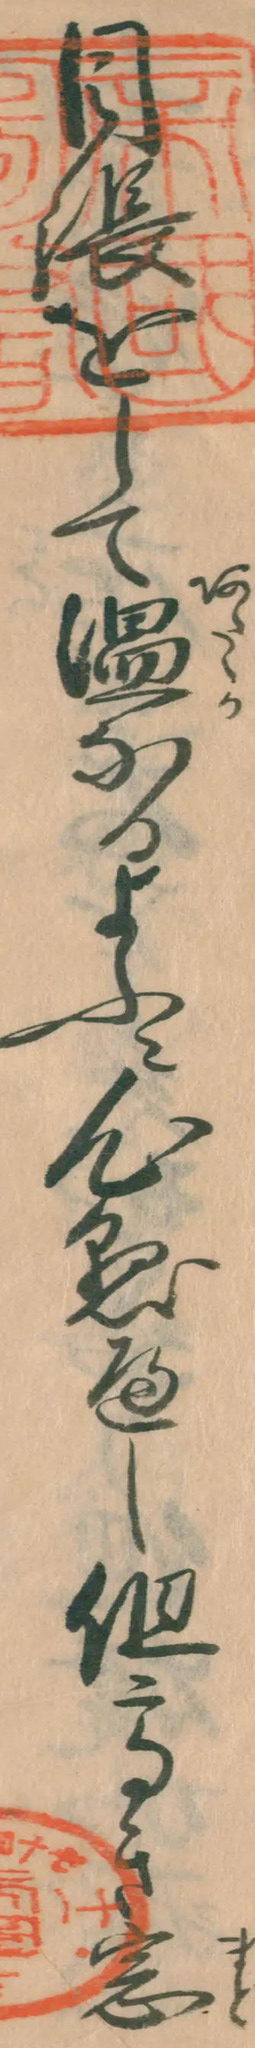目張をして温なるよふに心懸へし但高き窓
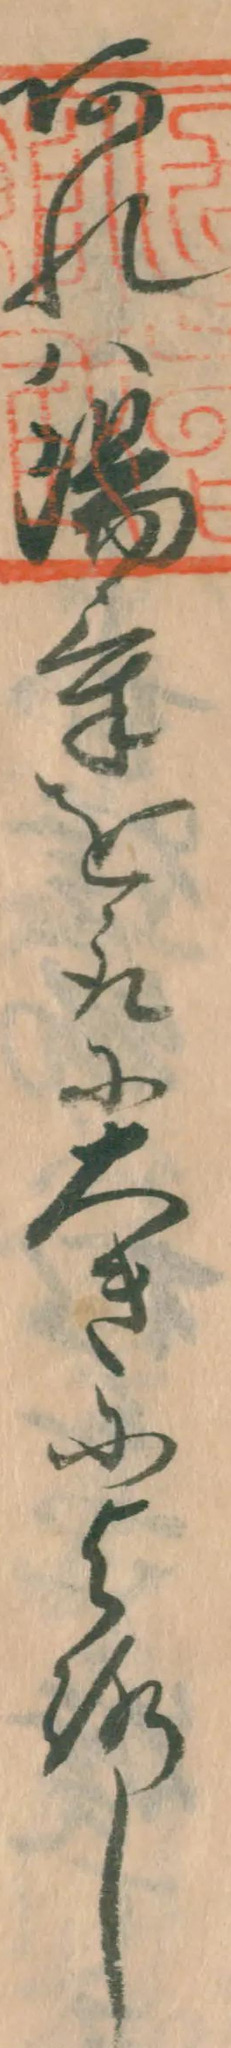あれは湯気を取に大きによろし
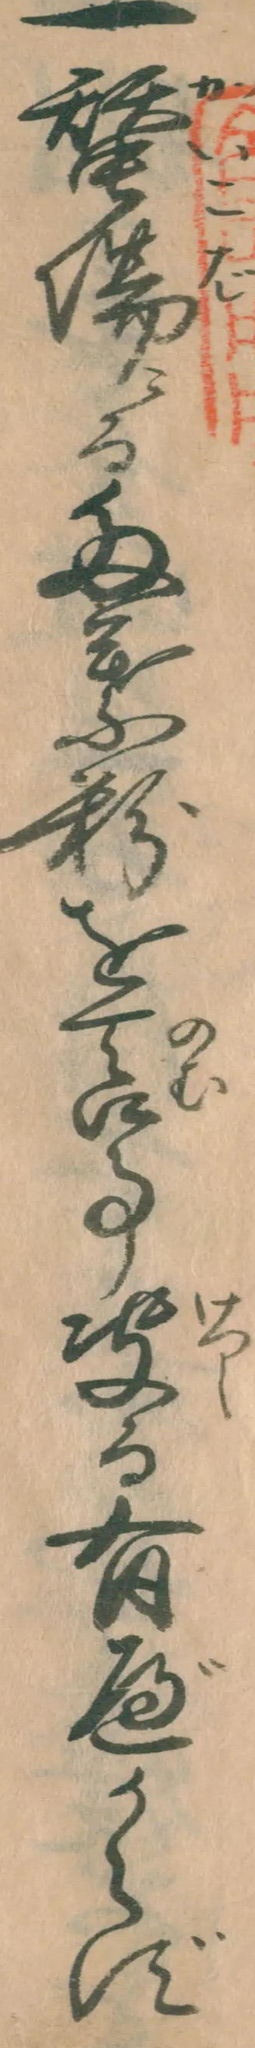一蚕場にて多葉粉を呑事決て有べからず
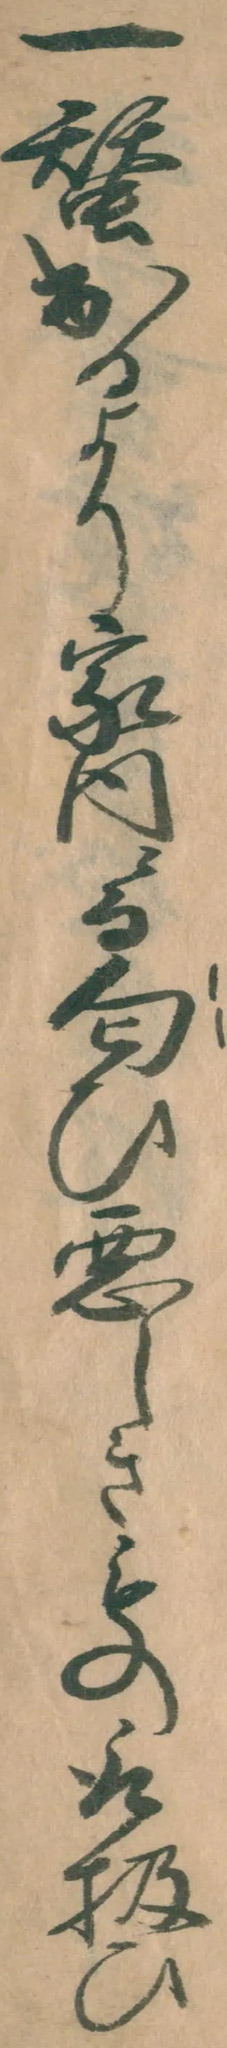一蚕出るより家内にて匂ひ悪しきもの取扱ひ

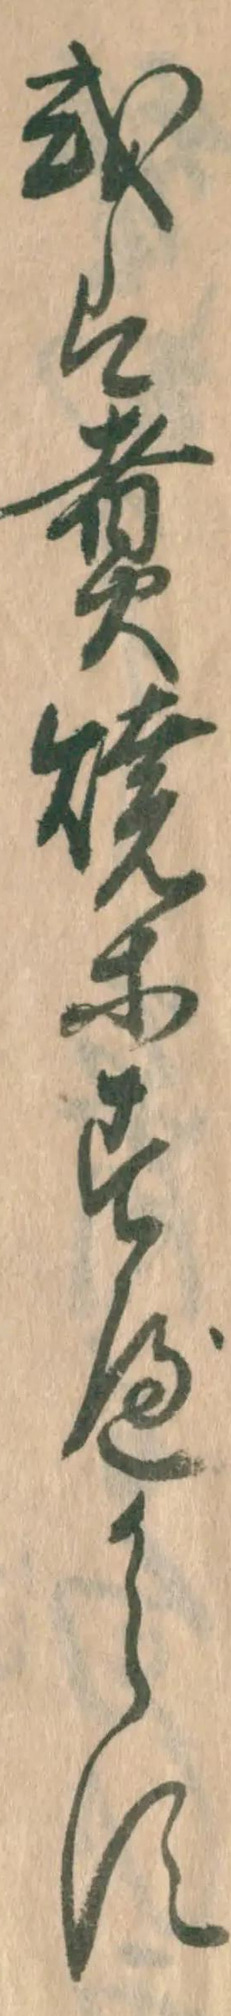或は煮焼等すべからす
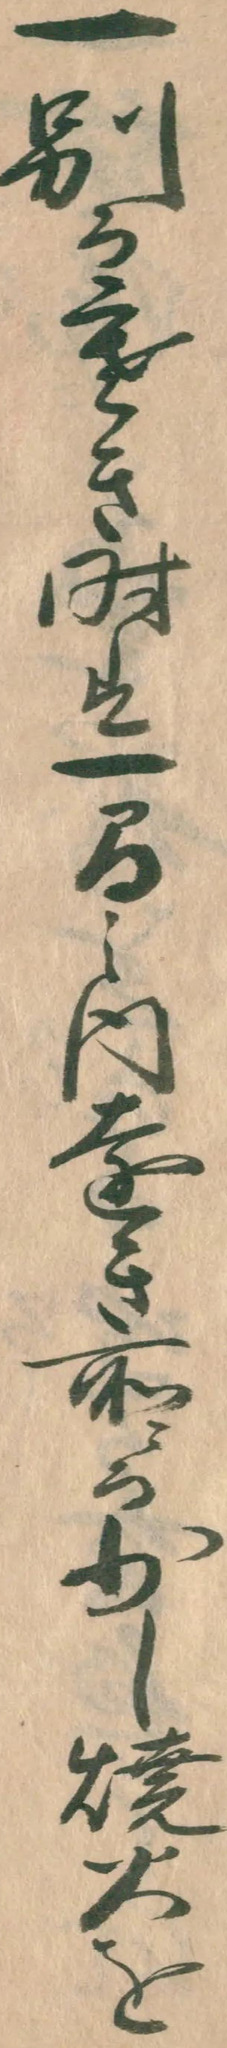一別て寒き時は一間之内遠き所にて少し焼火を
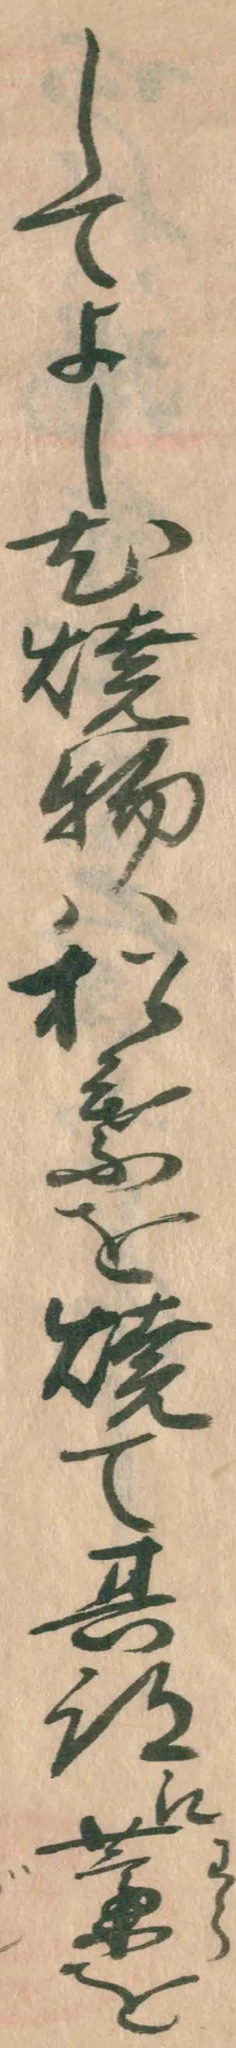してよし尤焼物は松葉を焼て其跡え藁を
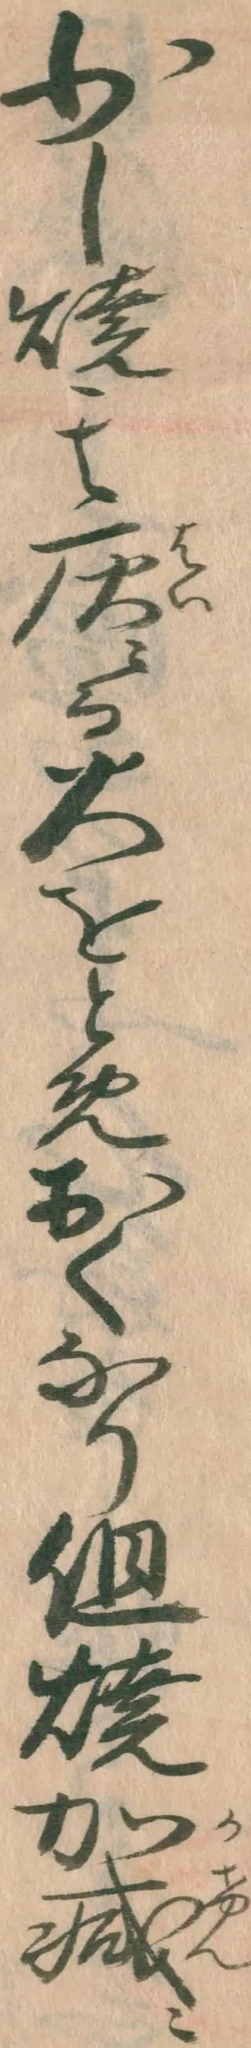少し焼其灰にて火をとめおくなり但焼加減に
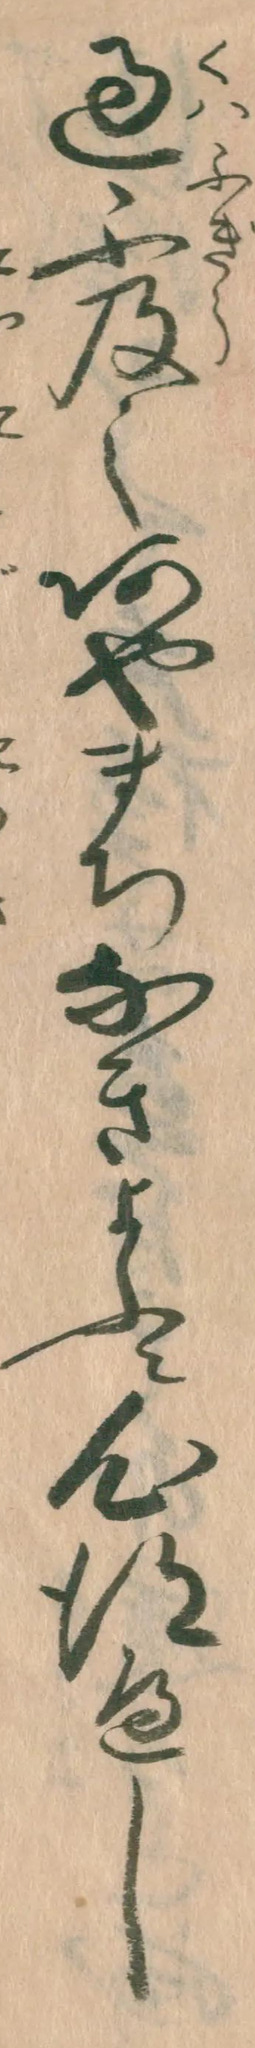過不及のあやまちなきよふに心得へし
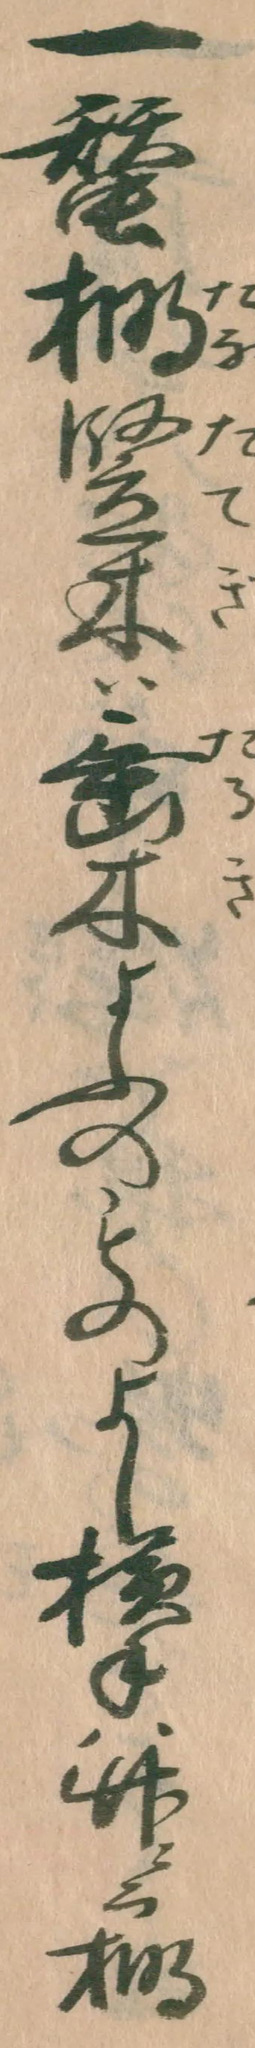一蚕棚竪木は垂木よふのものよし横手は竹にて棚
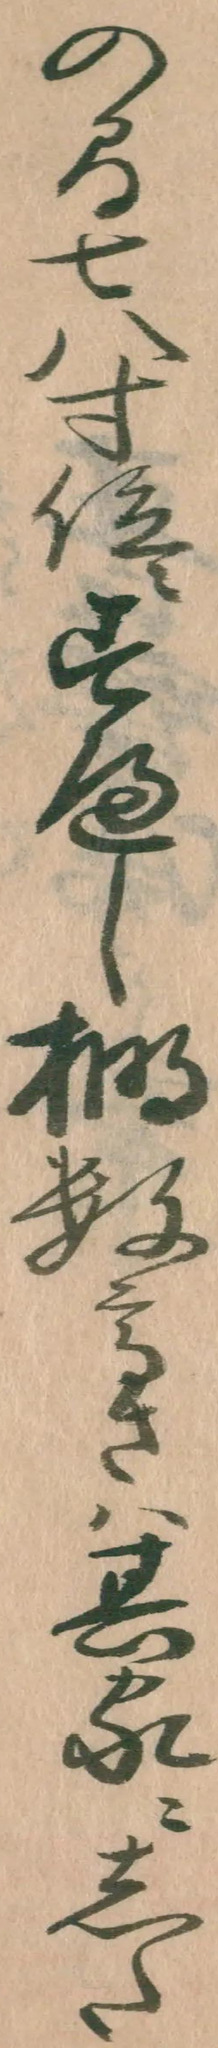の間七八寸位にすへし棚数高きは其家にした
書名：養蚕録
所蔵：国立国会図書館 National Diet Library, JAPAN
